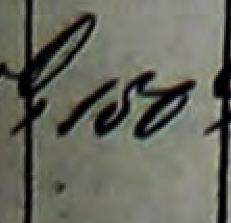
0,150
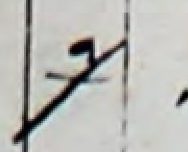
7
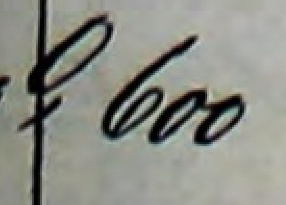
0,600
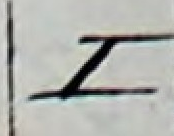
I
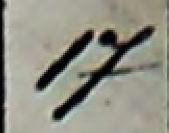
17
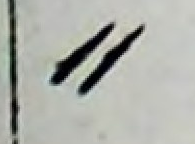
11
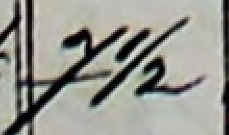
7 ½
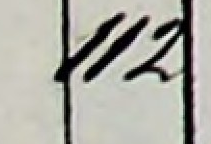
112
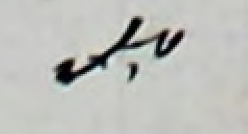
do
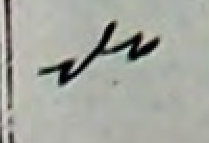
do
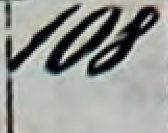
108
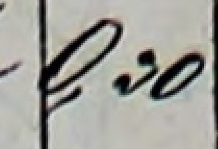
0,30
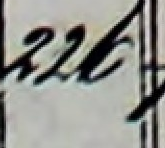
226
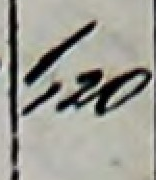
1,20
